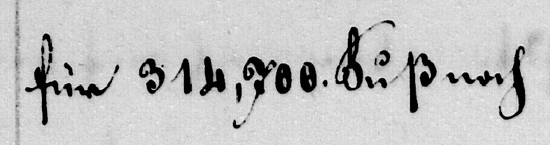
für 314,700 Fuß noch
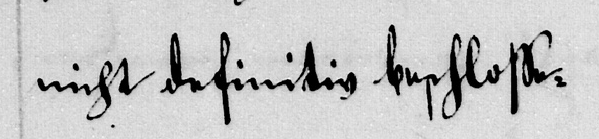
nicht definitiv beschloße¬
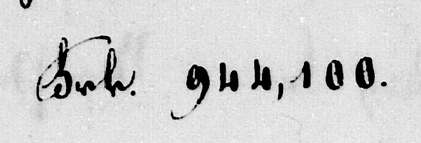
Frk. 944,100
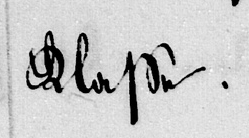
Klaße
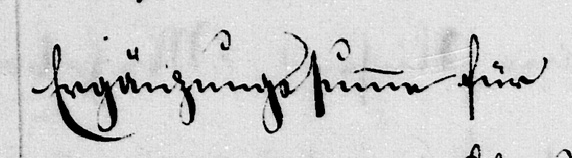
Ergänzungssumme für
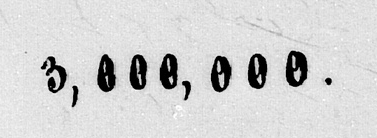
3,800,000.
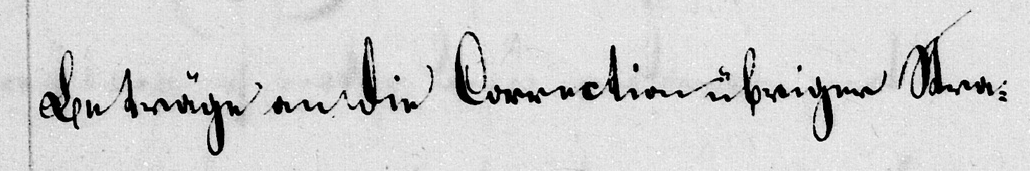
Beträge an die Correction übriger Stra¬
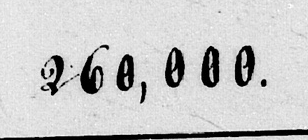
260,000.
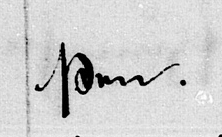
ßen
